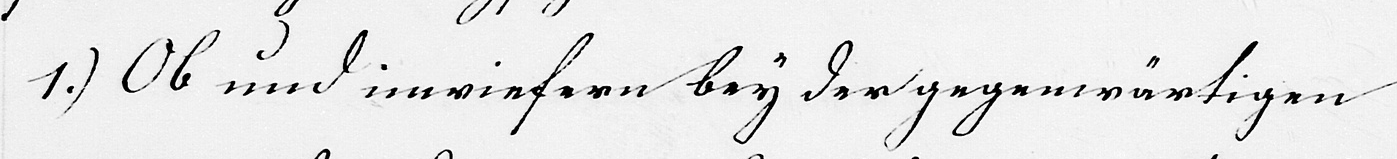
1.) Ob und inwiefern bey der gegenwärtigen
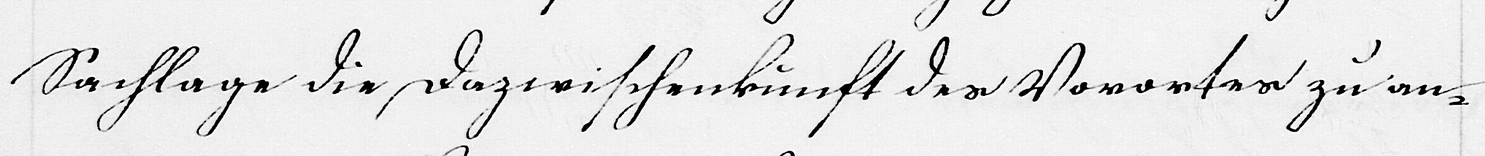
Sachlage die Dazwischenkunft des Vorortes zu an¬
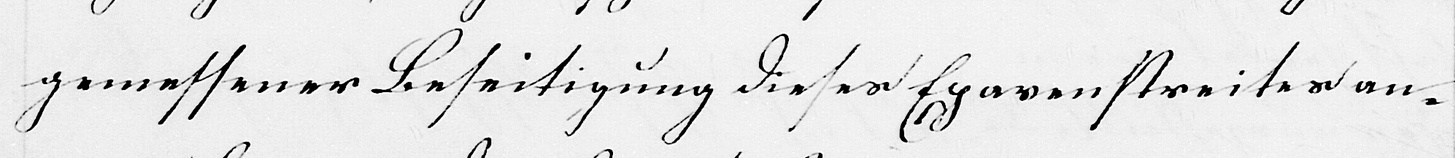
gemessener Beseitigung dieses [?Epavenstreites] an¬
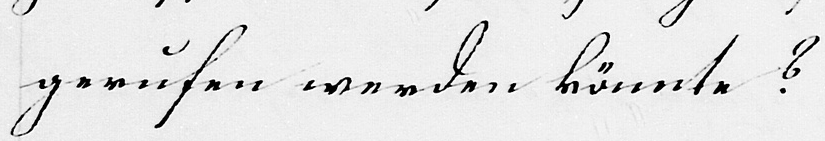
gerufen werden könnte?
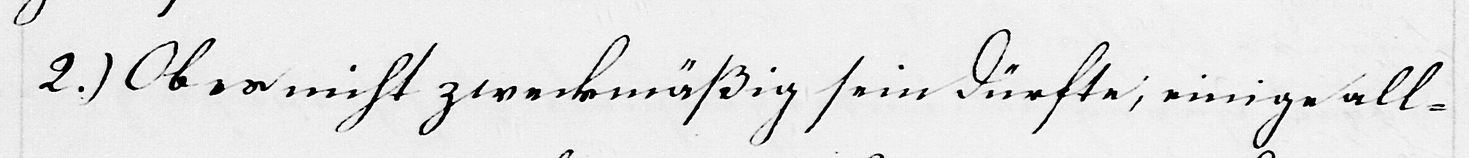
2.) Ob es nicht zweckmäßig sein dürfte, einige all¬
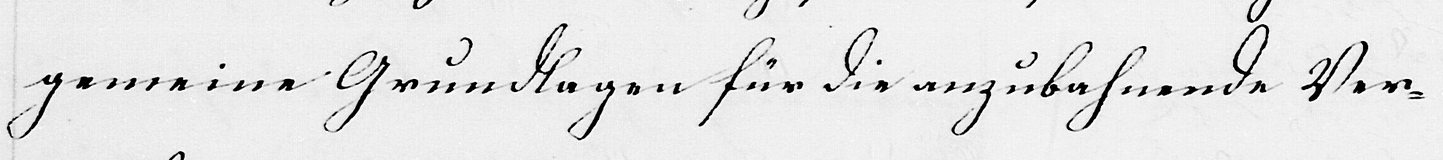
gemeine Grundlagen für die anzubahnende Ver¬
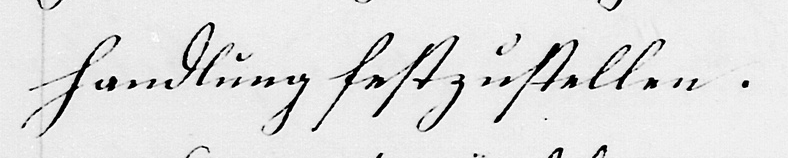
handlung festzustellen.
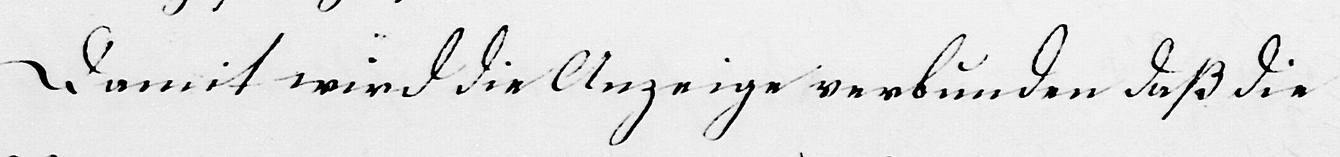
Damit wird die Anzeige verbunden daß die
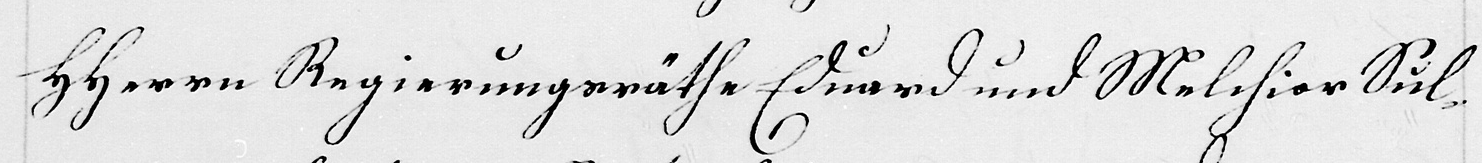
HHerrn Regierungsräthe Eduard und Melchior Sul¬
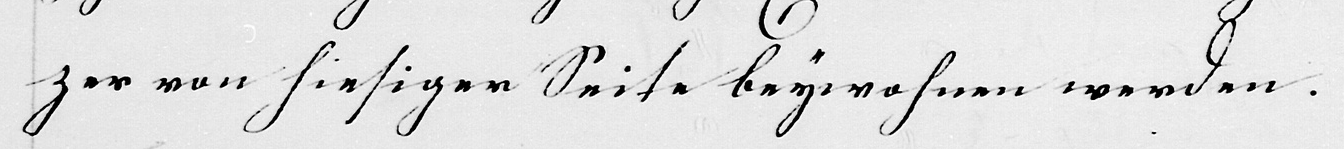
zer von hiesiger Seite beywohnen werden.
